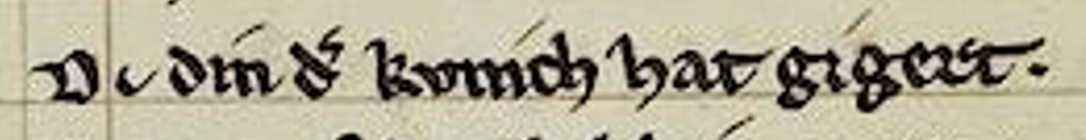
D(az) din d(er) kvnich hat gigert.
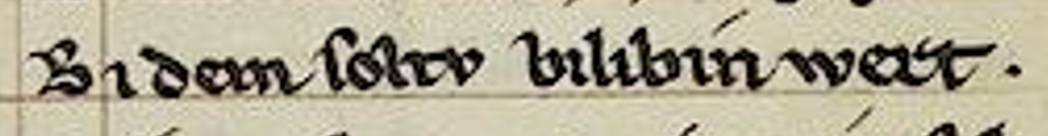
Bi dem ſoltv bilibin wert.
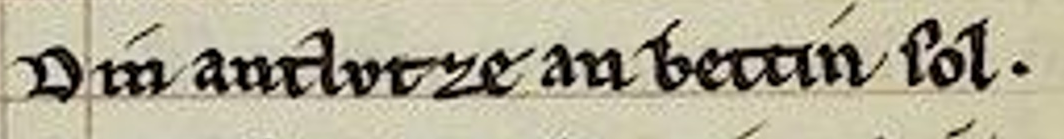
Din antlvtze an bettin ſol.
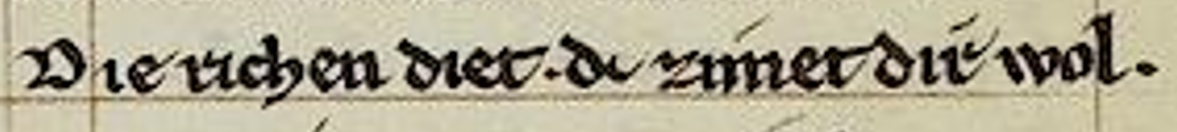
Die richen diet. d(az) zimet dir wol.
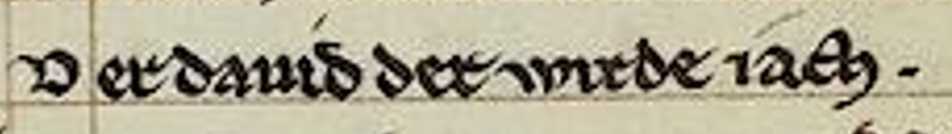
Der dauid der wirde iach.
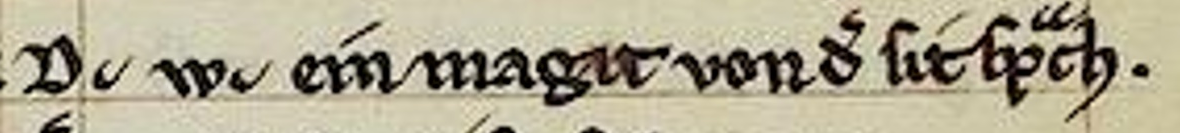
D(az) w(az) ein magit von d(er) ſit ſp(ra)ch.
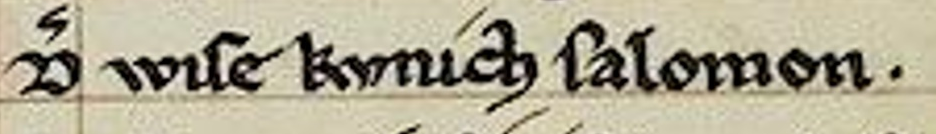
D(er) wiſe kvnich ſalomon.
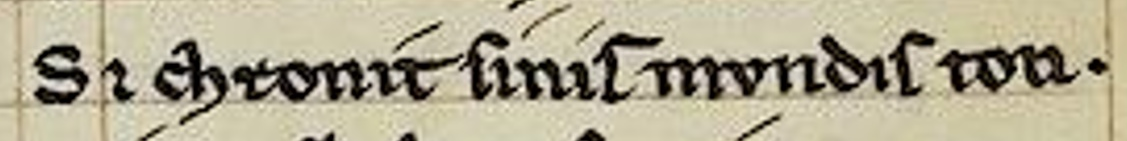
Si chronit ſiniſ mvndiſ ton.
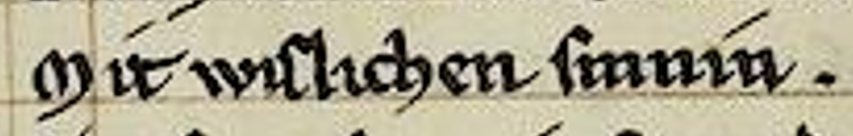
Mit wiſlichen ſinnin.
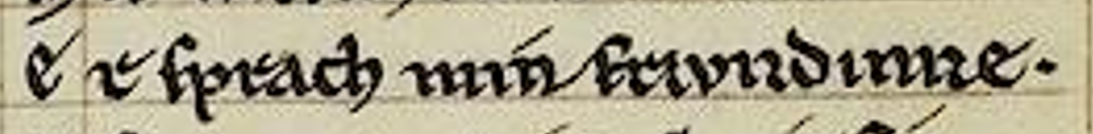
Er ſprach min frivndinne.
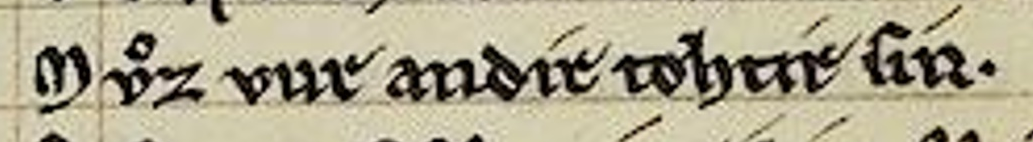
Mv°oz vur andir tohtir ſin.
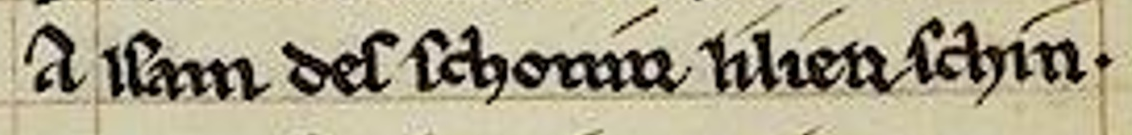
Alſam deſ ſchonin lilien ſchin.
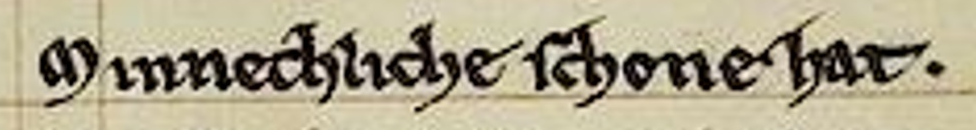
Minnechliche ſchone hat.
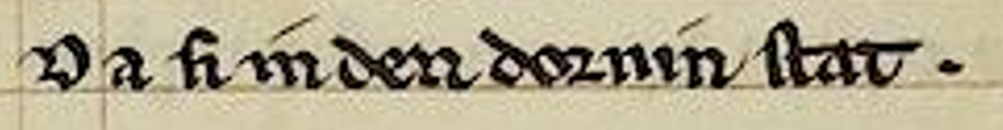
Da ſi in den dornin ſtat.
